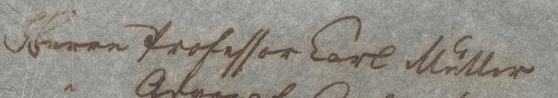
Hherrn Professor Carl Müller
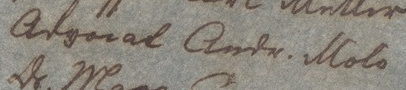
Advocat Andr. Molo
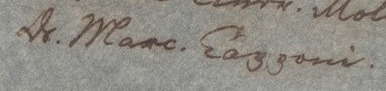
Dr. Marc. Cazzoni.
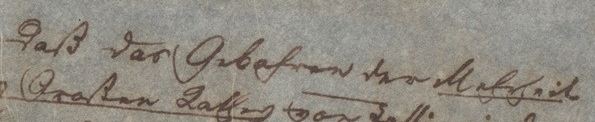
Daß das Gebahren der Mehrheit
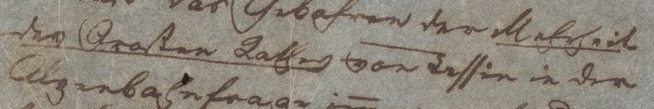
des Großen Rathes von Tessin in der
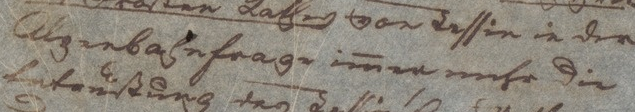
Alpenbahnfrage immer mehr die
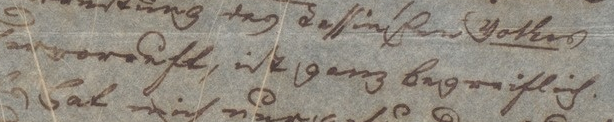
hervorruft, ist ganz begreiflich.
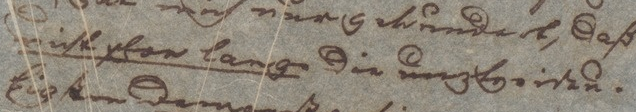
nicht schon lange die unzweideu-
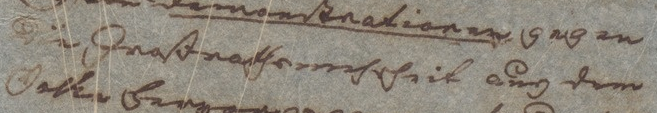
die Großrathsmehrheit aus dem
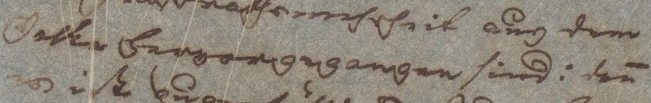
Volke hervorgegangen sind: denn
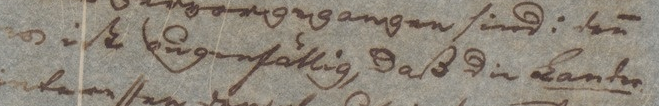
es ist augenfällig, daß die Landes -
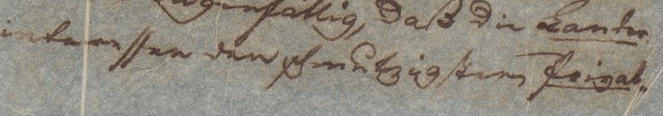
interessen den schmutzigsten Privat -
